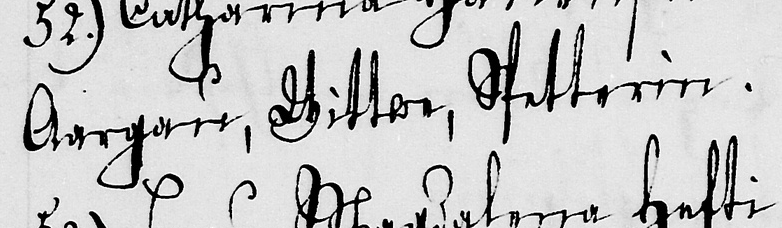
Aargau, Wittwe, Spetterin.
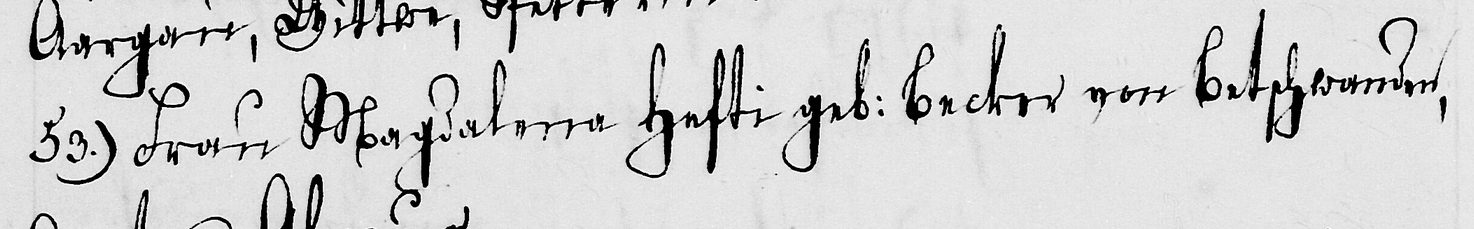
53.) Frau Magdalena Hefti geb: Becker von Betschwanden,
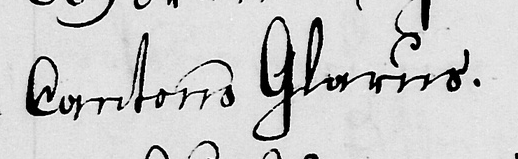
Cantons Glarus.
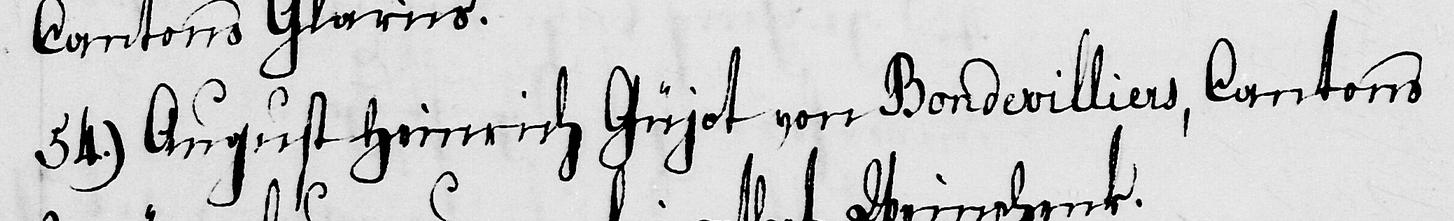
54.) August Heinrich Güjot von Bondevilliers, Cantons
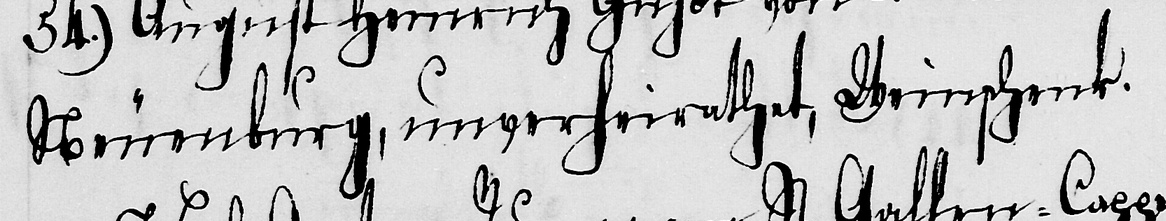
Neuenburg, unverheirathet, Weinschenk.
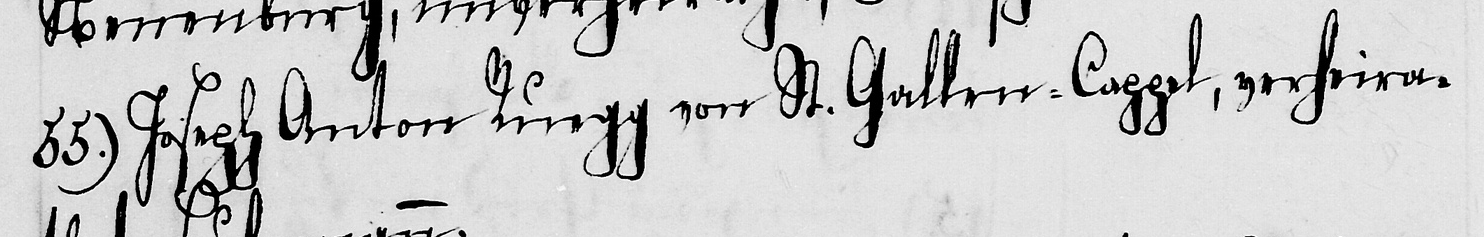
55.) Joseph Anton Ruegg von St. Gallen-Cappel, verheira¬
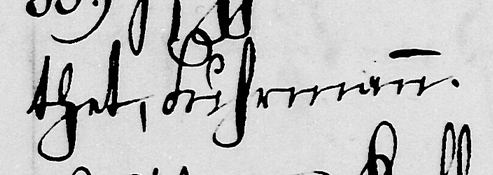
thet, Fuhrmann.
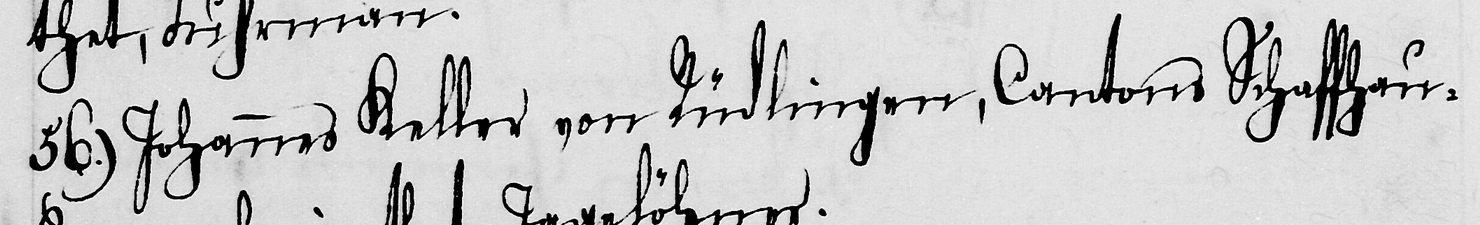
56.) Johannes Keller von Rüdlingen, Cantons Schaffhau¬
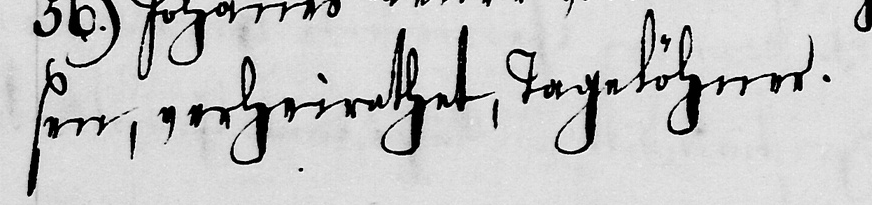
sen, verheirathet, Tagelöhner.
